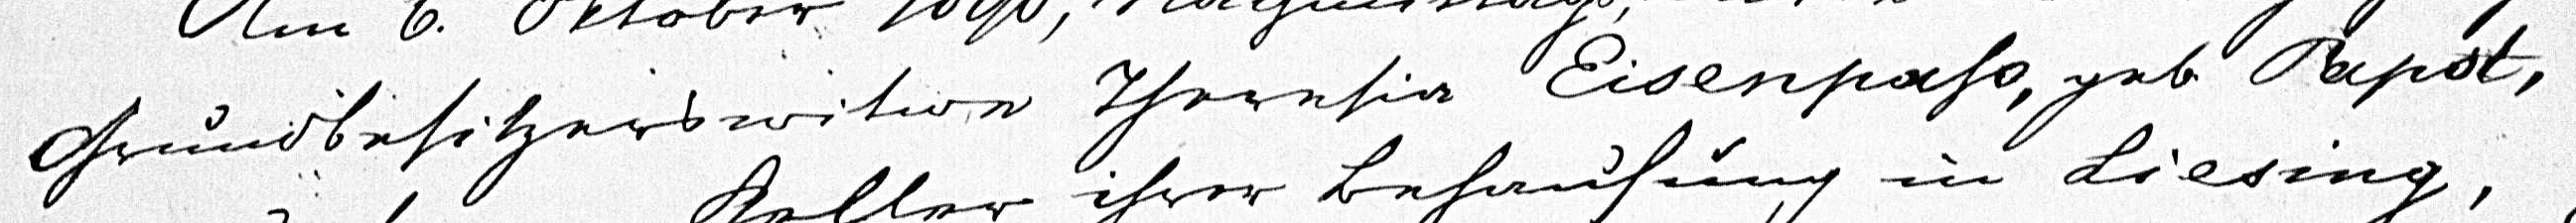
Grundbesitzerswitwe Theresia Eisenpass, geb Papst,
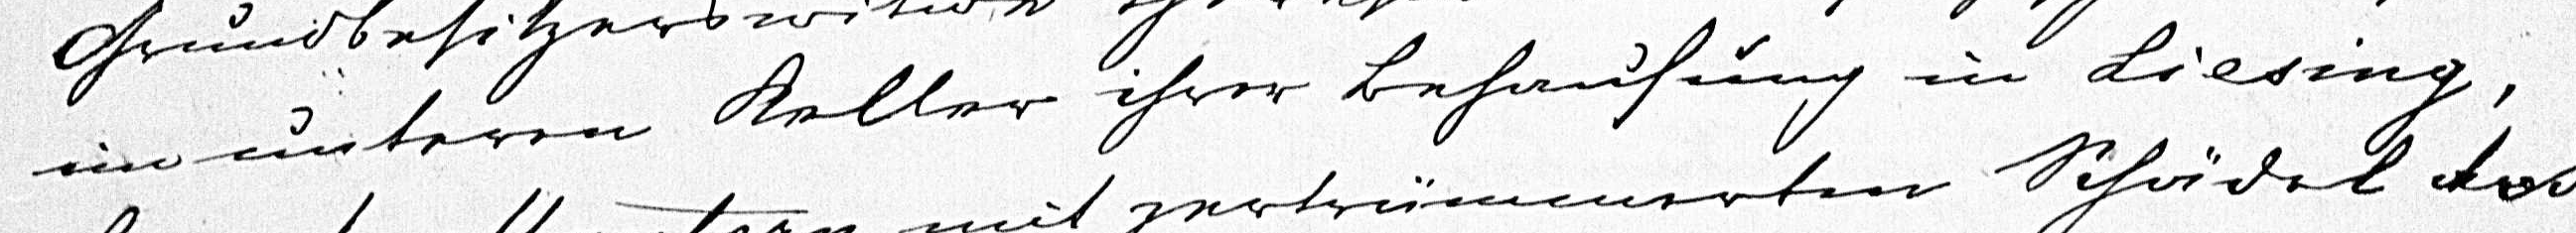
im unteren Keller ihrer Behausung in Liesing,
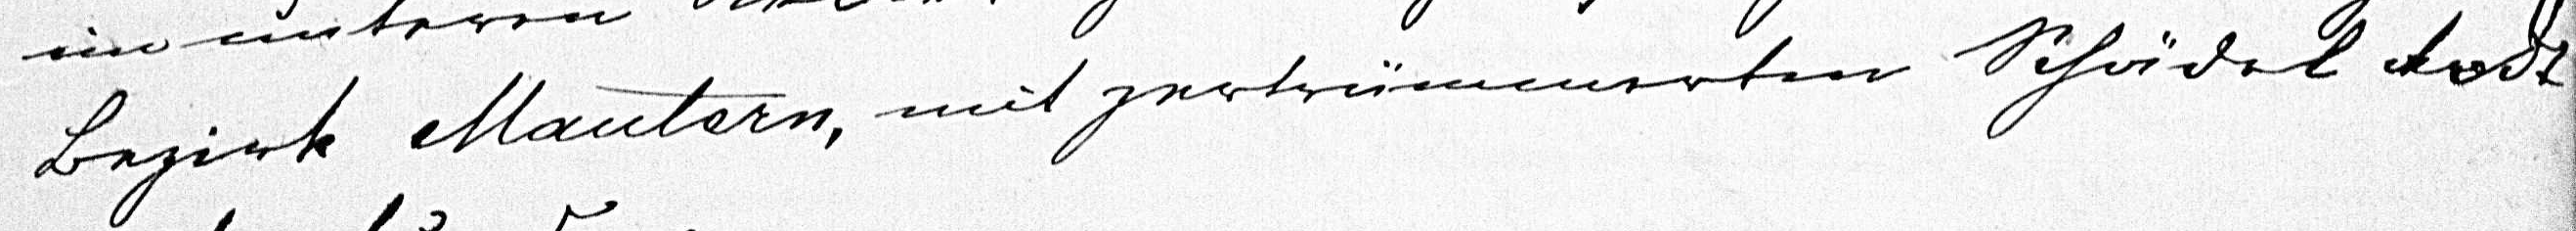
Bezirk Mautern, mit zertrümmerten Schädel todt
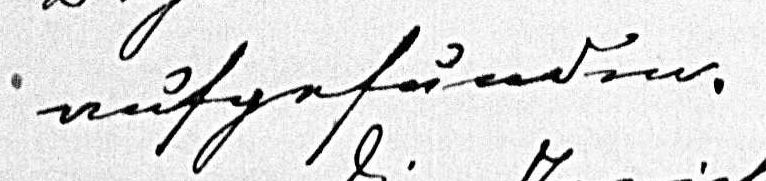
aufgefunden.
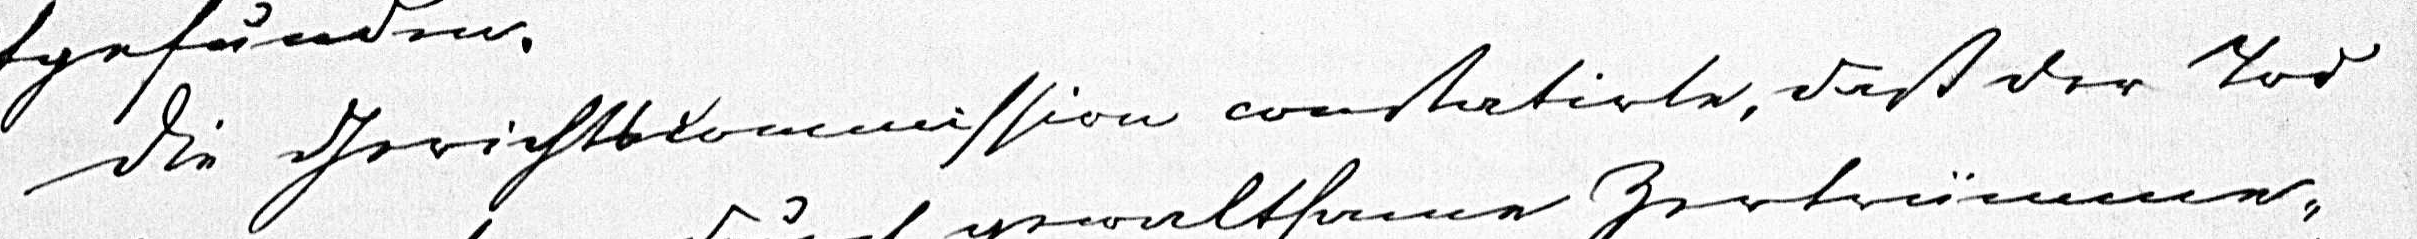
Die Gerichtskommission constatirte, daß der Tod
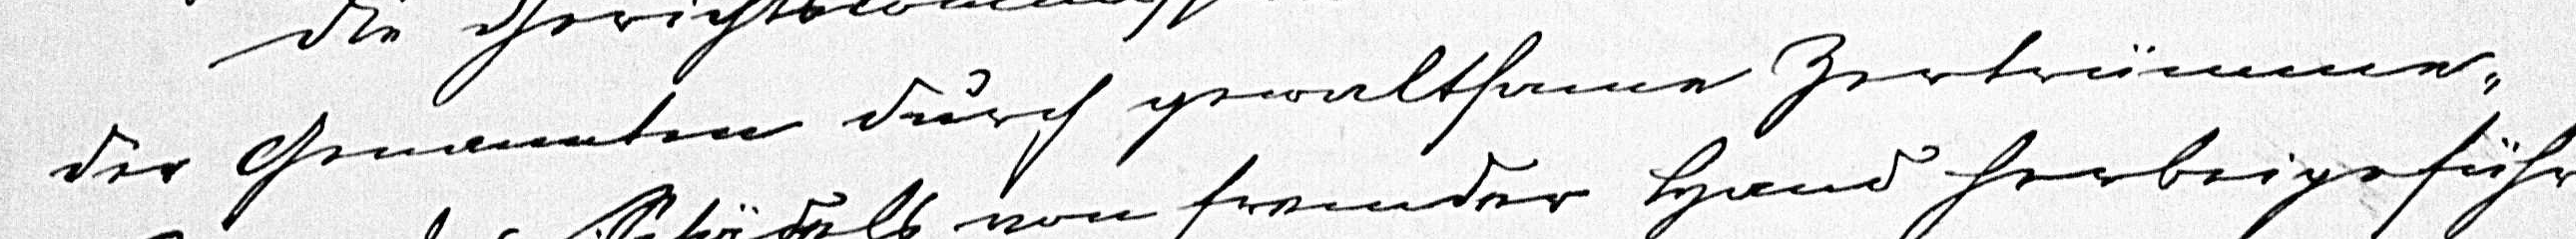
der Genannten durch gewaltsame Zertrümme¬
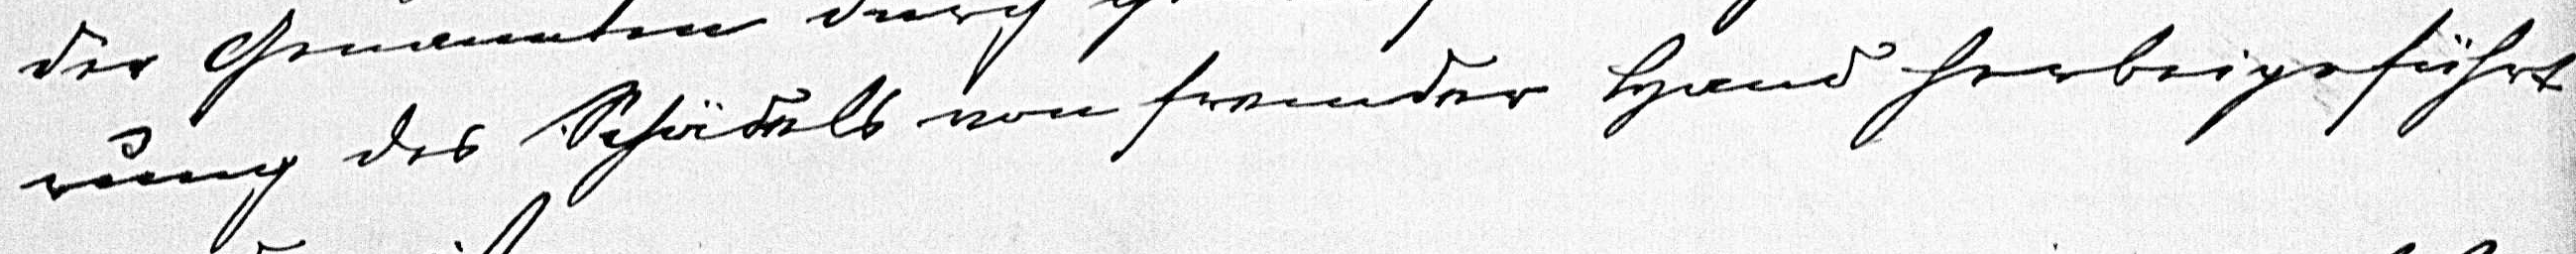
rung des Schädels von fremder Hand herbeigeführt
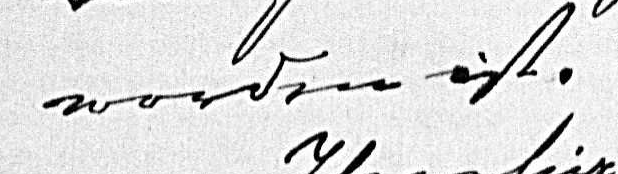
worden ist.
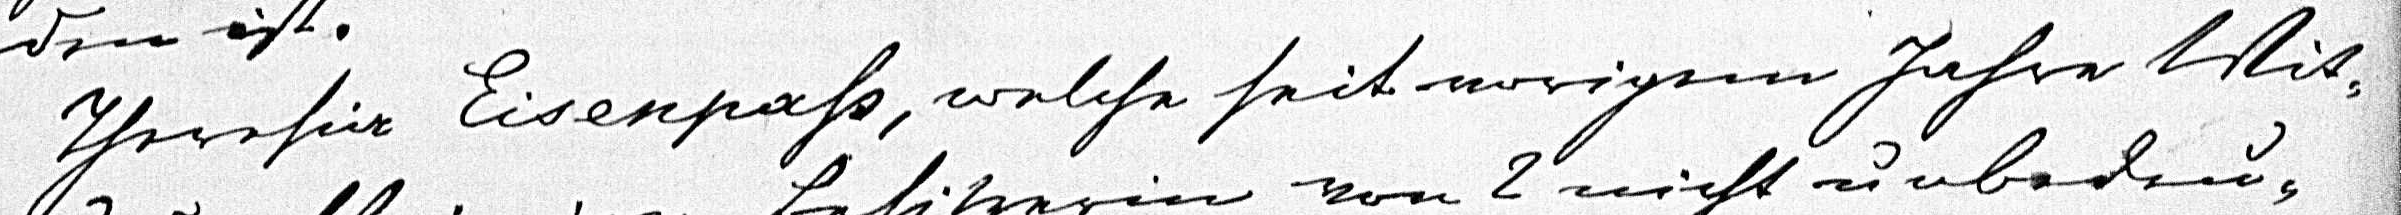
Theresia Eisenpass, welche seit vorigen Jahre Wit¬
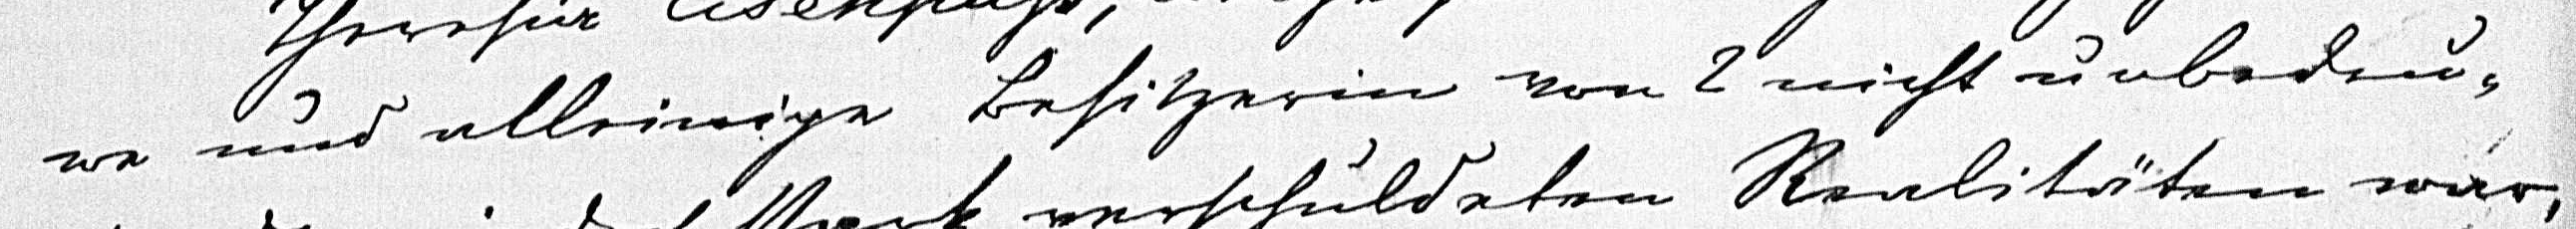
we und alleinige Besitzerin von 2 nicht unbedeu¬
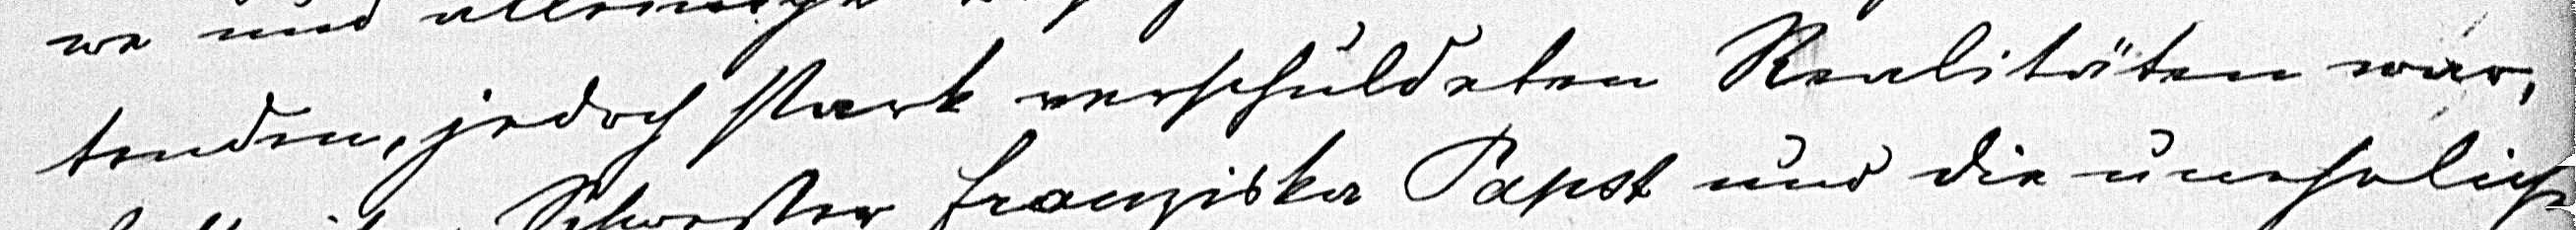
tenden, jedoch stark verschuldeten Realitäten war,
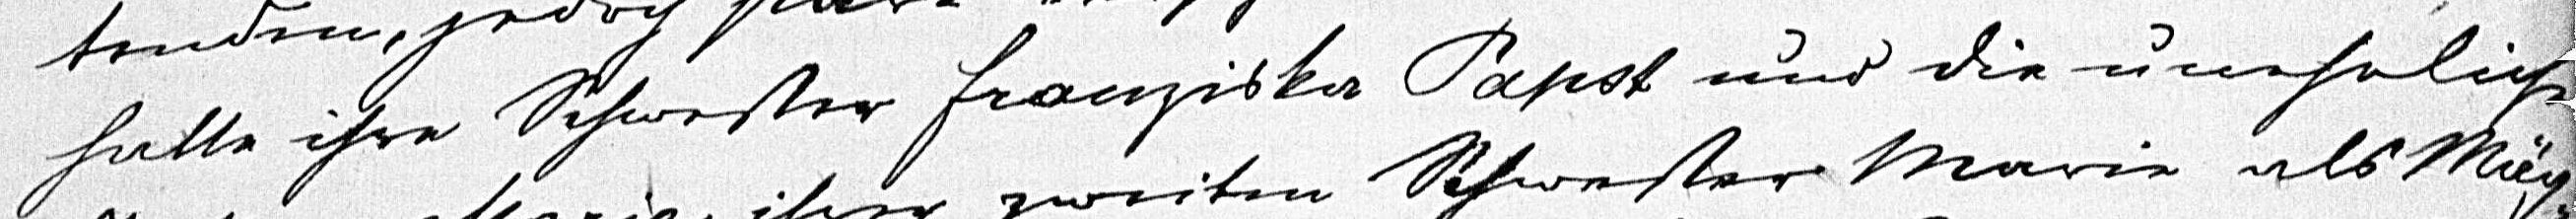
hatte ihre Schwester Franziska Papst und die uneheliche
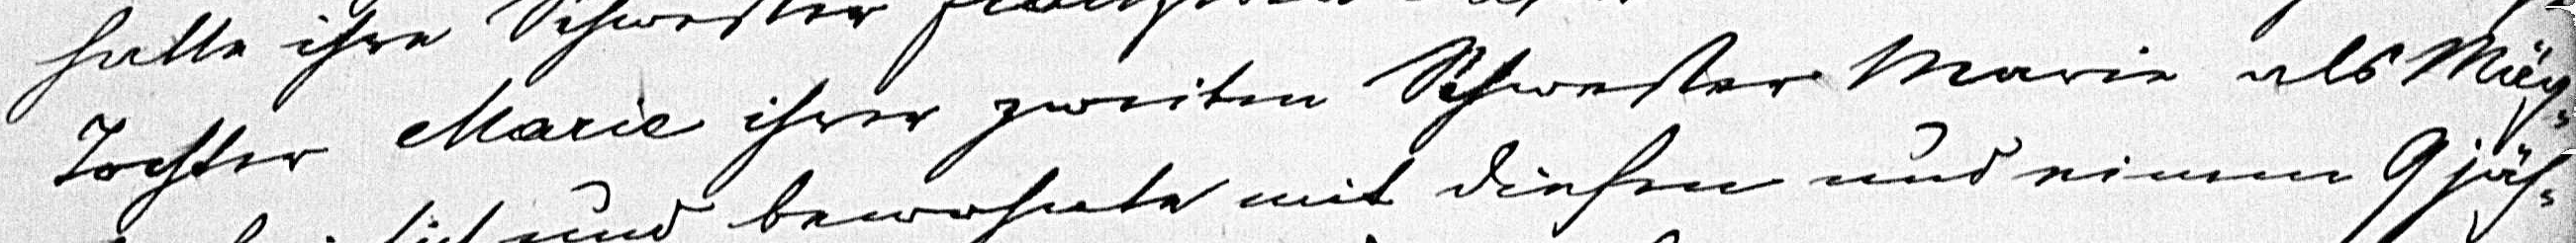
Tochter Marie ihrer zweiten Schwester Marie als Mäg¬
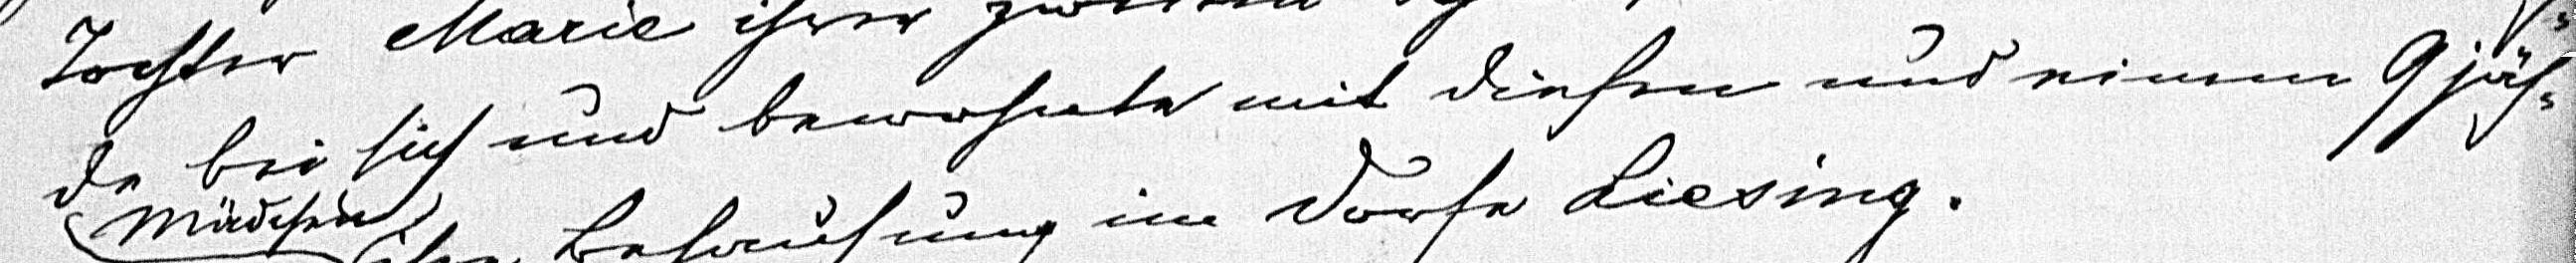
de bei sich und bewohnte mit diesen und einem 9 jäh¬
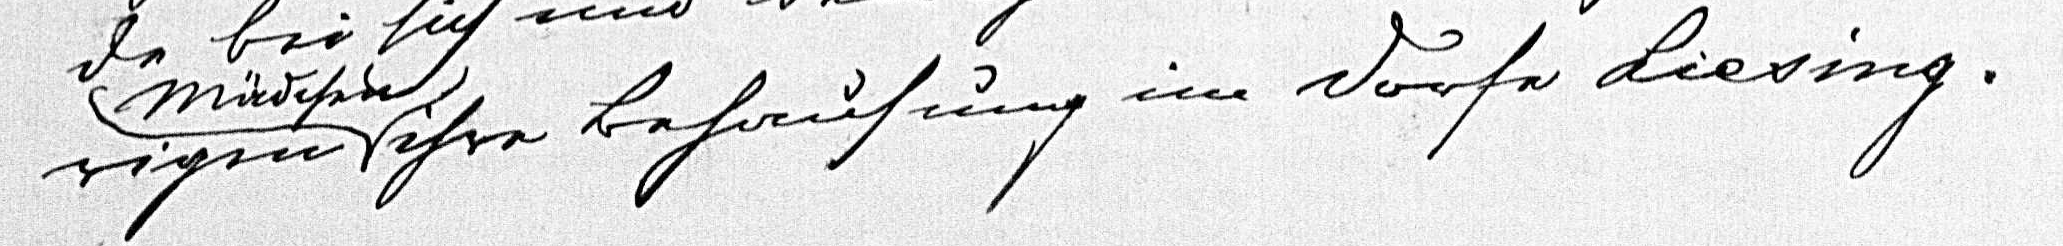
Mädchen
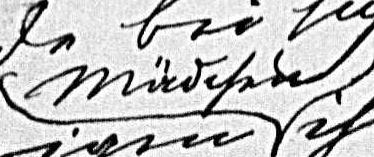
rigen ihre Behausung im Dorfe Liesing.
